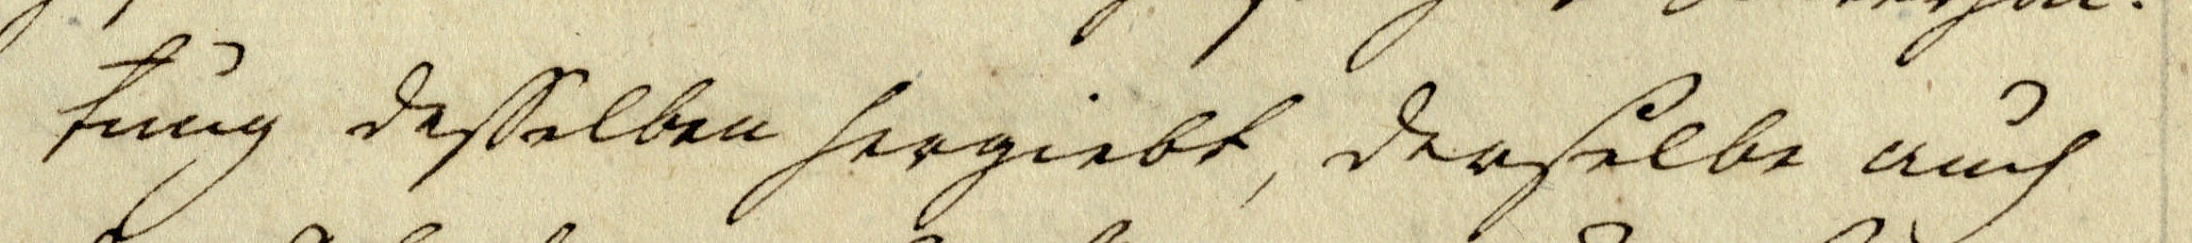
tung desselben hergiebt, derselbe auch
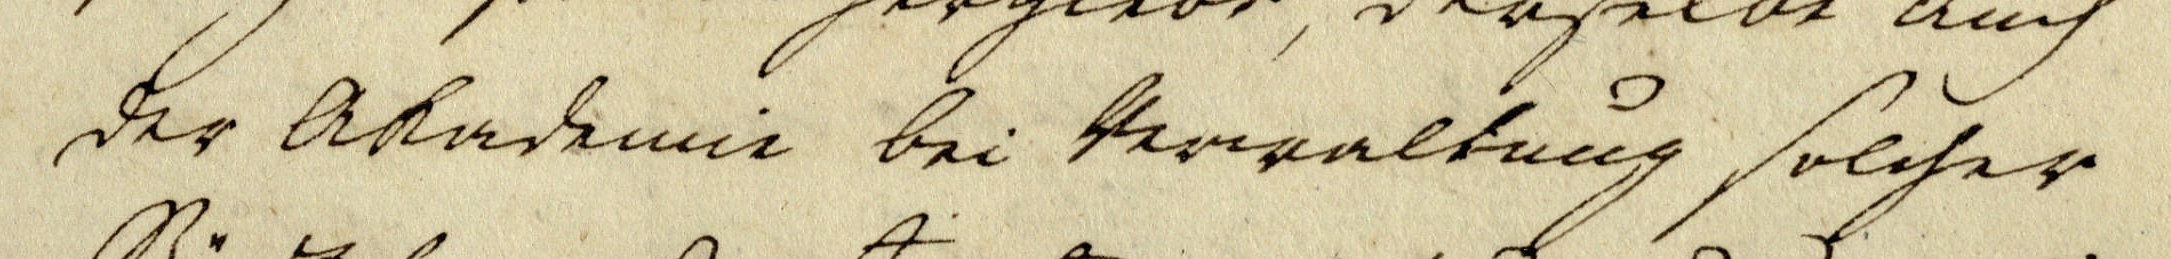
der Akademie bei Verwaltung solcher
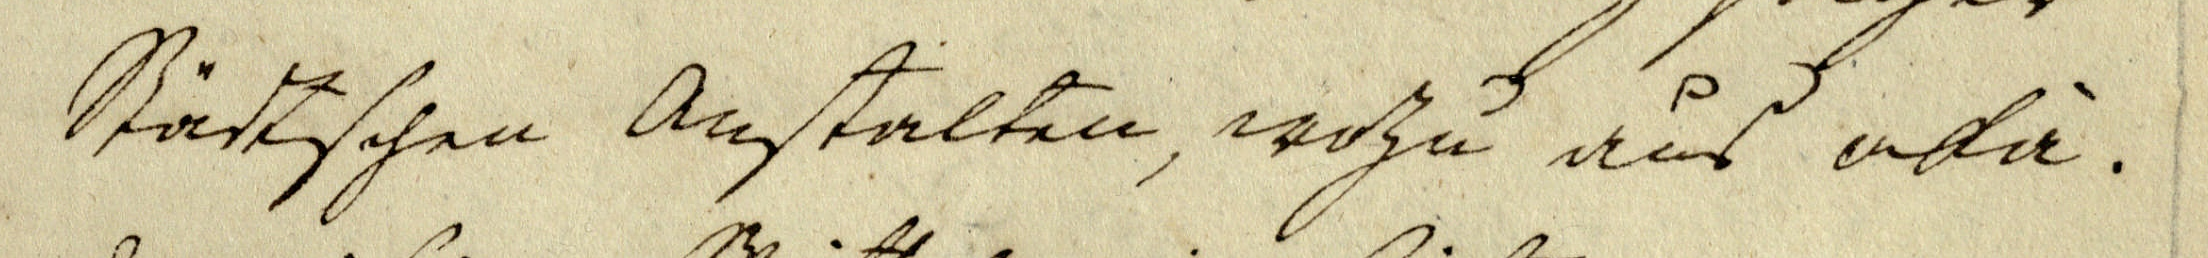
Städtschen Anstalten, wozu aus aka¬
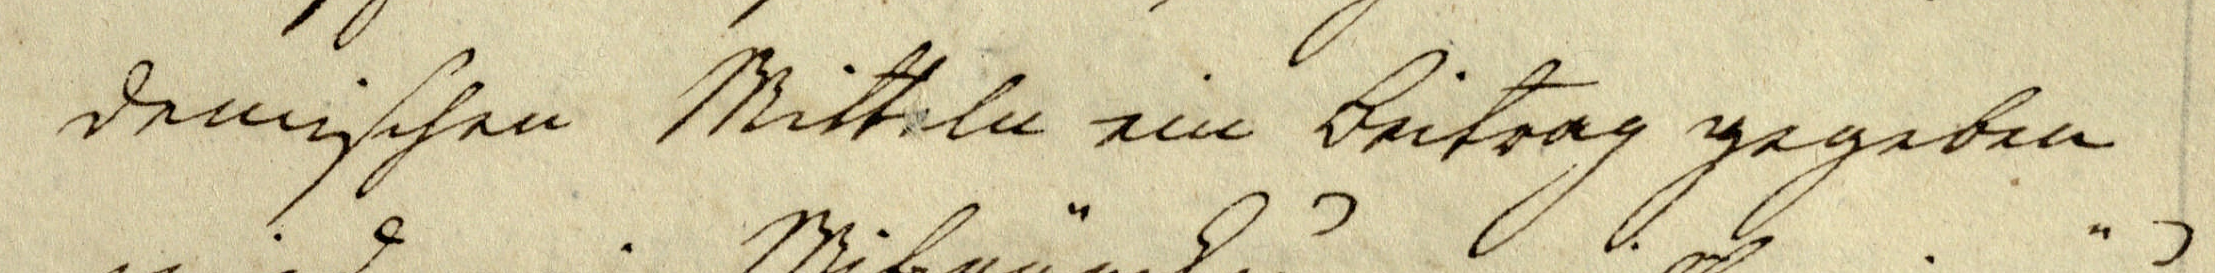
demischen Mitteln ein Beitrag gegeben
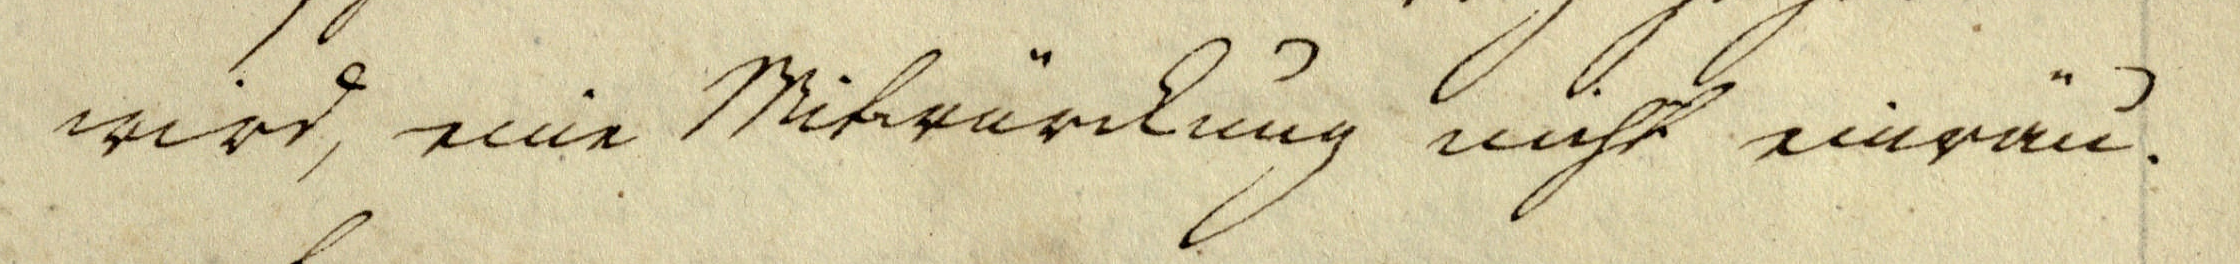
wird, eine Mitwürckung nicht einräu¬
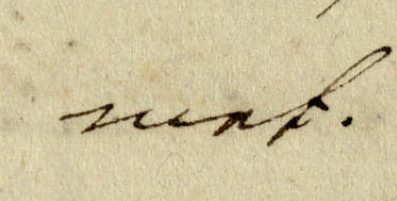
met.
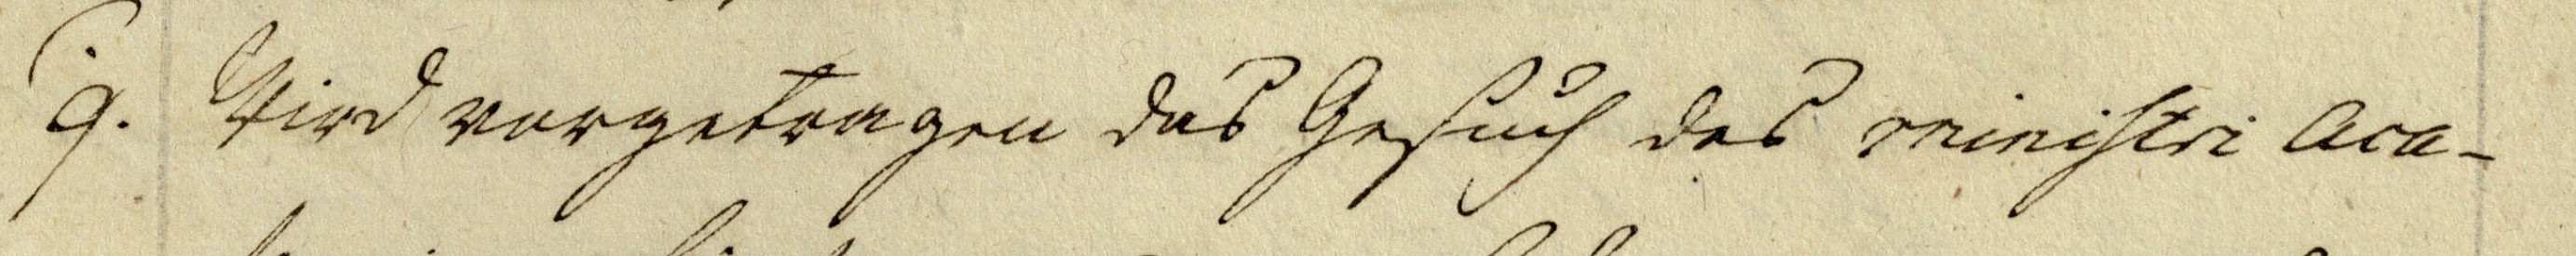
9. Wird vorgetragen das Gesuch des ministri Aca¬
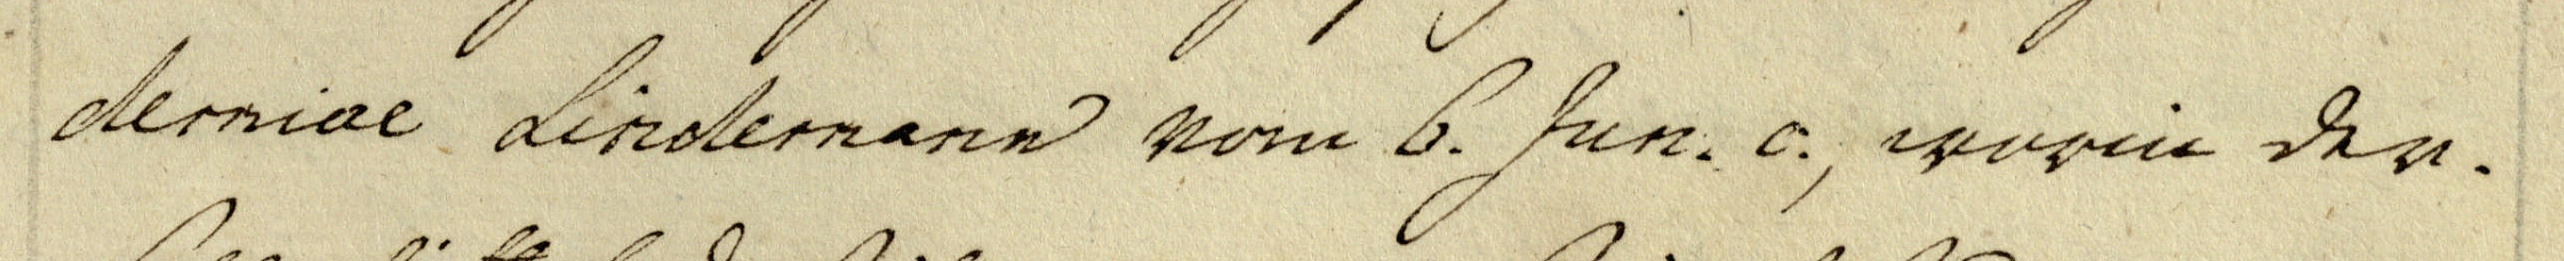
demiae Lindemann vom 6. Jun. c., worin der¬
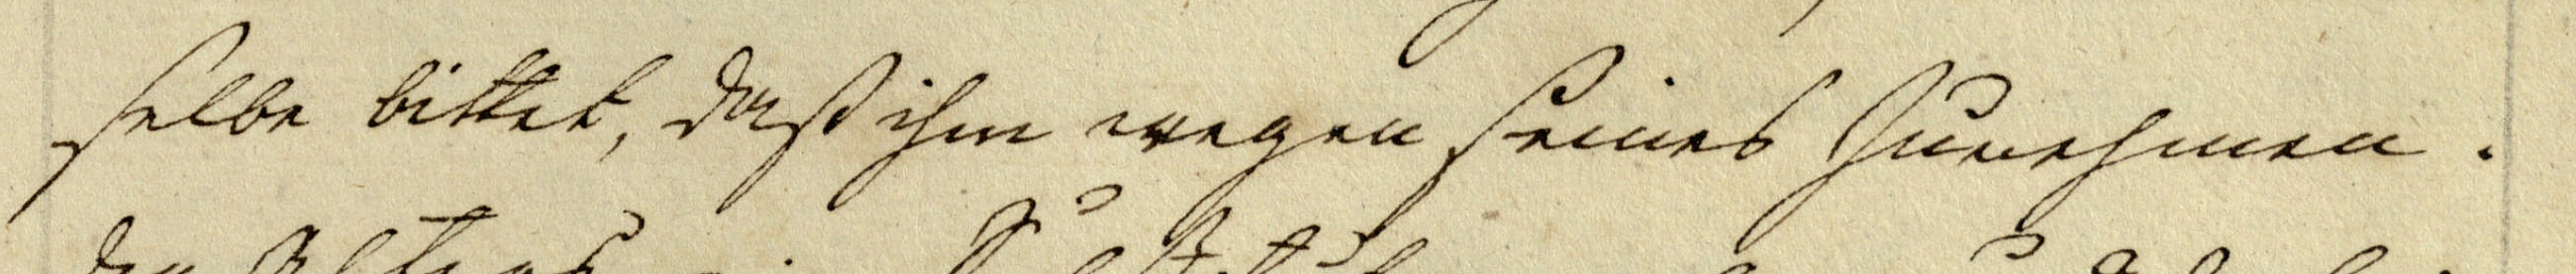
selbe bittet, daß ihm wegen seines zunehmen¬
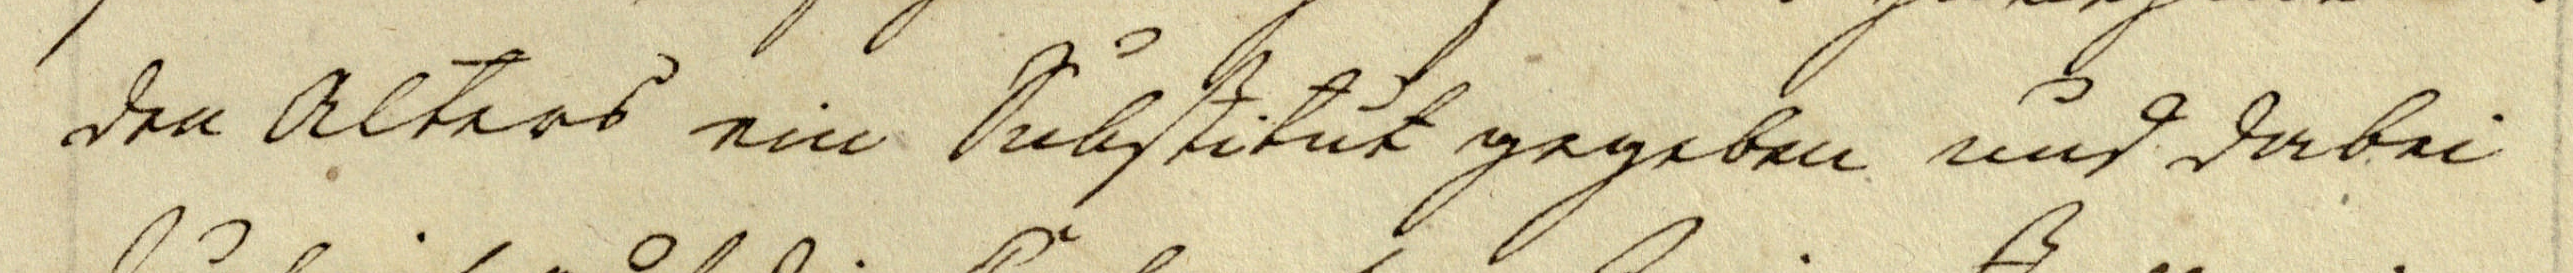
den Alters ein Substitut gegeben und dabei
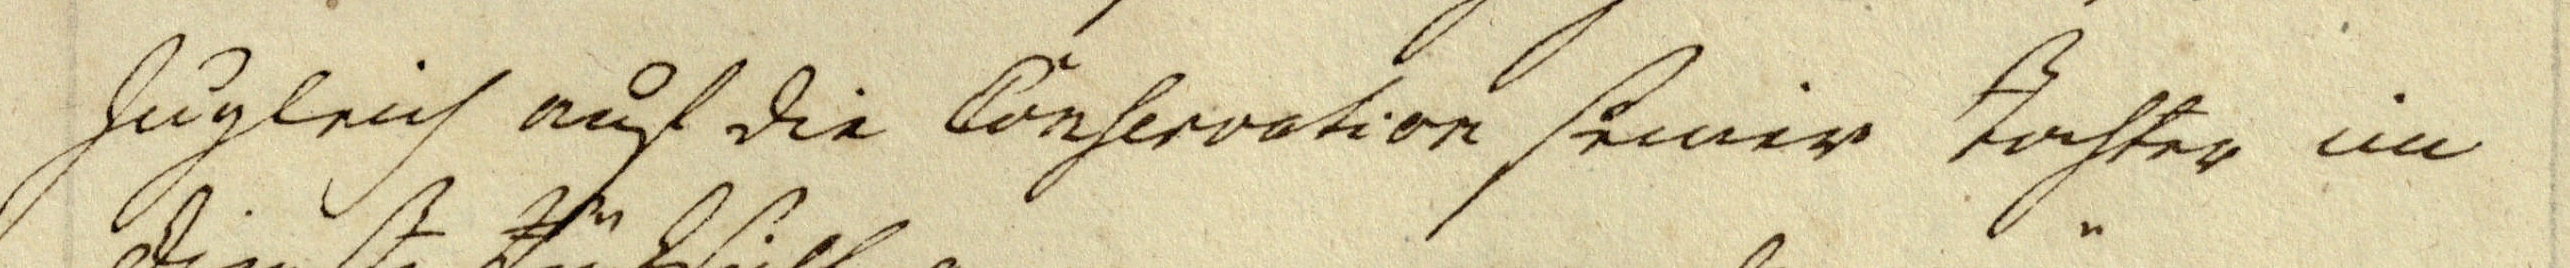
zugleich auf die Conservation seiner Tochter im
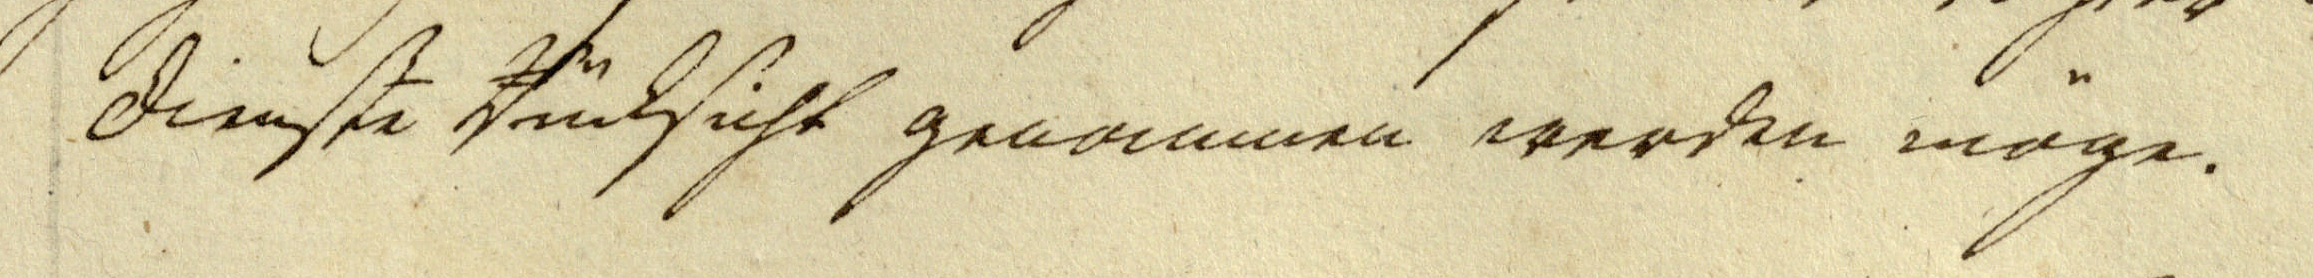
Dienste Rücksicht genommen werden möge.
